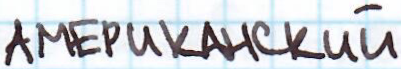американский
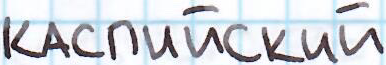каспийский
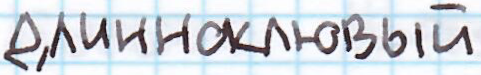длинноклювый
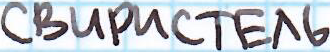свиристель
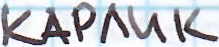карлик
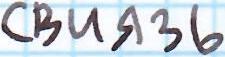свиязь
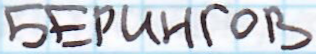берингов
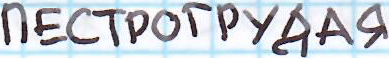пестрогрудая
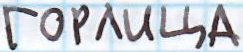горлица
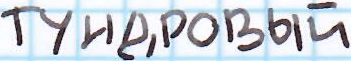тундровый
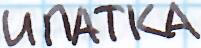ипатка
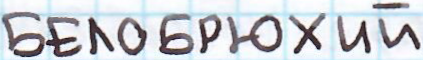белобрюхий
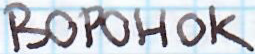воронок
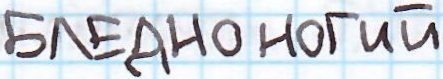бледноногий
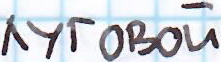луговой
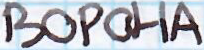ворона
